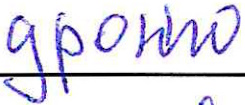дронго
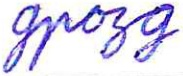дрозд
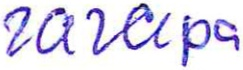гагара
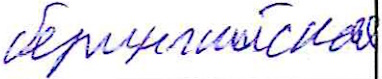берингийская
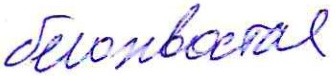белохвостая
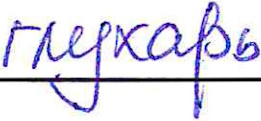глухарь
